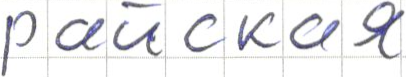райская
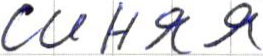синяя
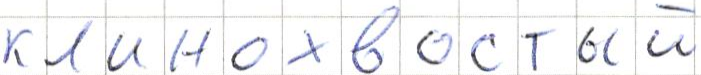клинохвостый
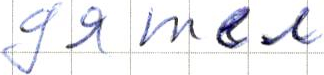дятел
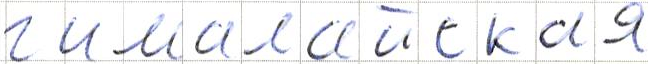гималайская
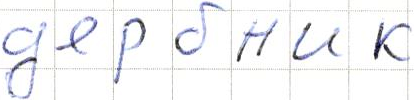дербник
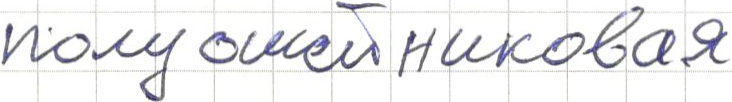полуошейниковая
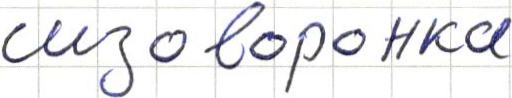сизоворонка
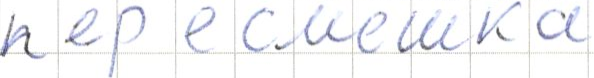пересмешка
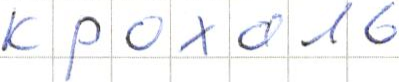крохаль
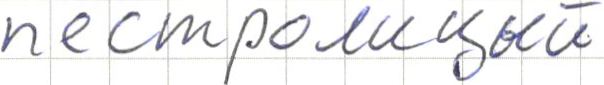пестролицый
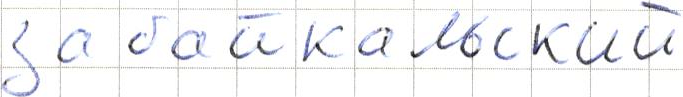забайкальский
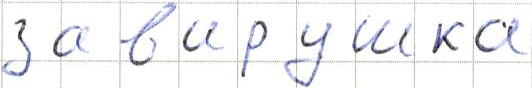завирушка
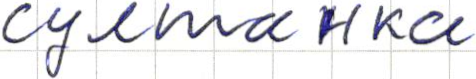султанка
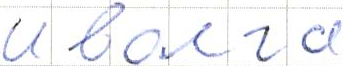иволга
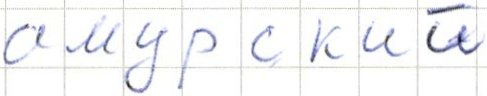амурский
